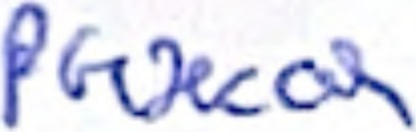рыжая
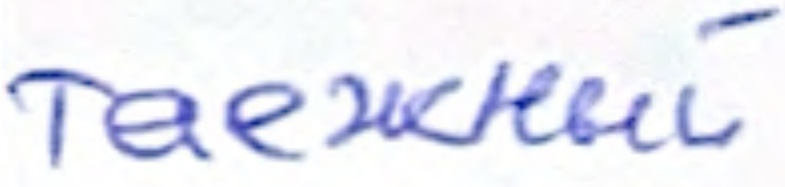таежный
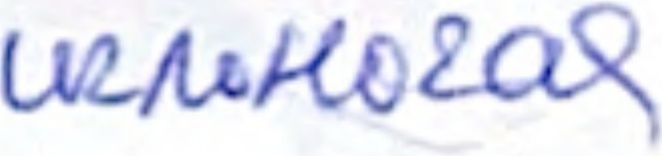иглоногая
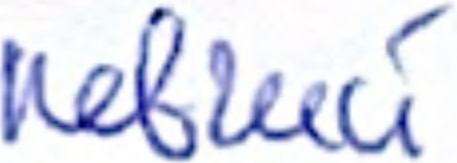певчий
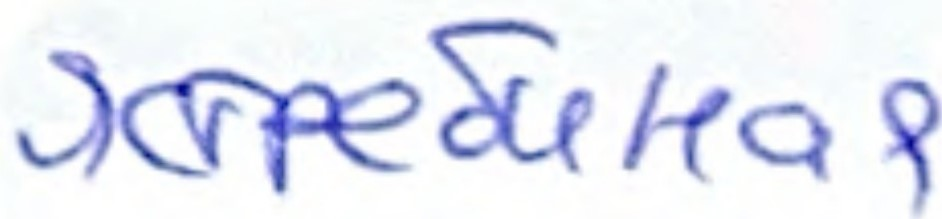ястребиная
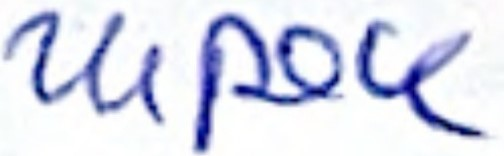чирок
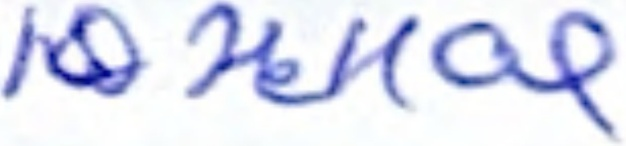южная
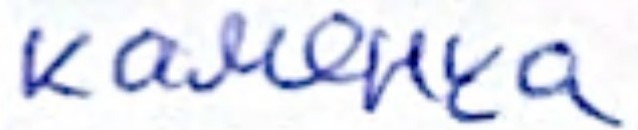каменка
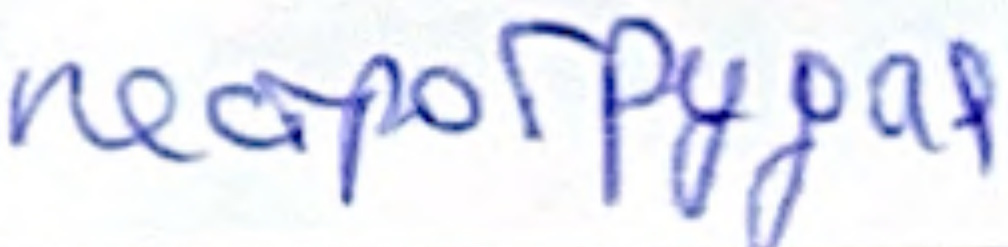пестрогрудая
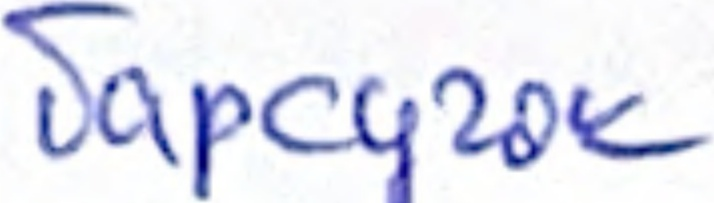барсучок
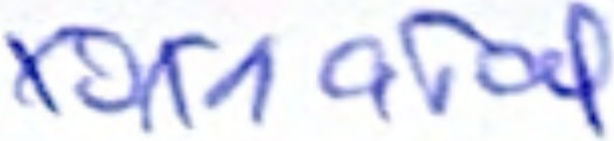хохлатая
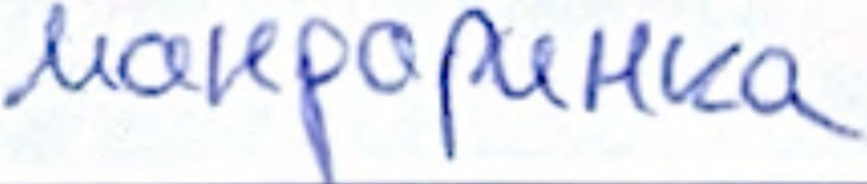манраринка
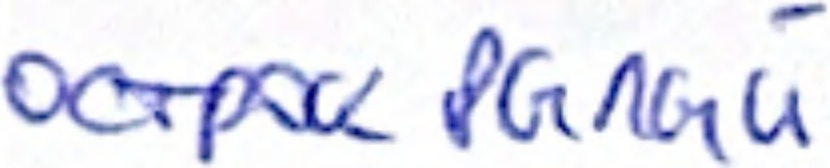острок рылый
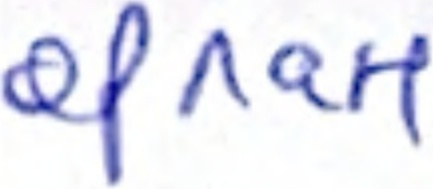орлан
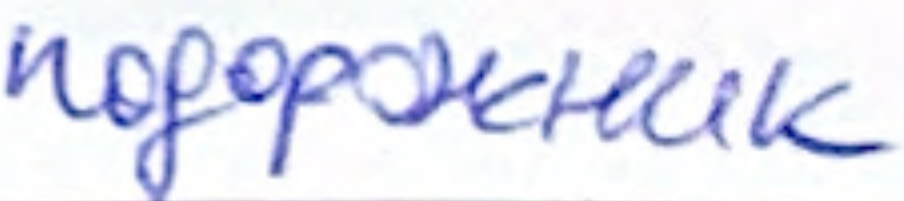подорожник
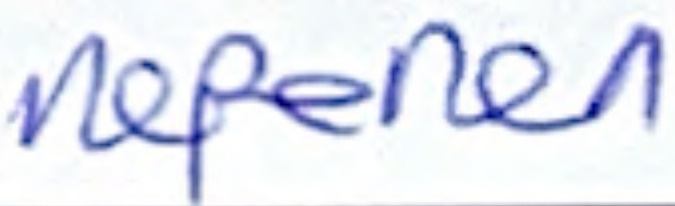перепел
